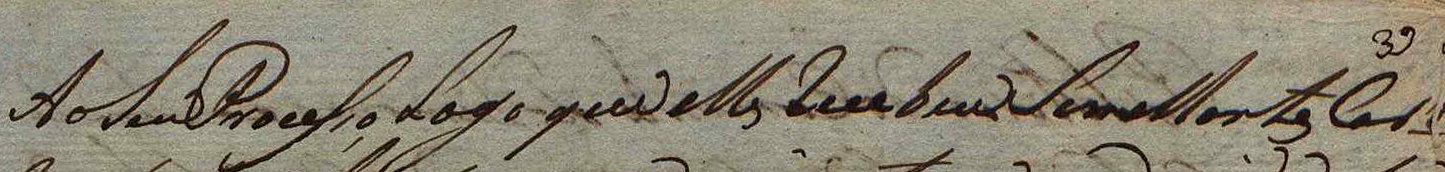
Ao Seu Processo, Logo que elle Recebeu Semelhante Car
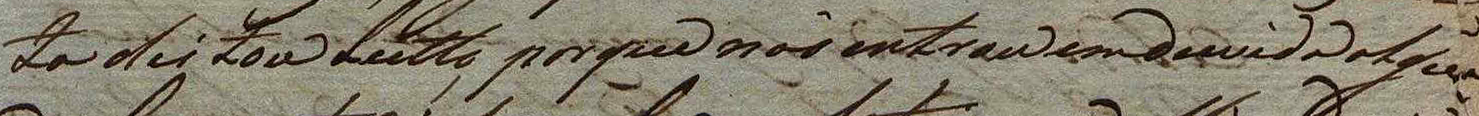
ta deitou Lutto, porque naõ entrou em duvida algu
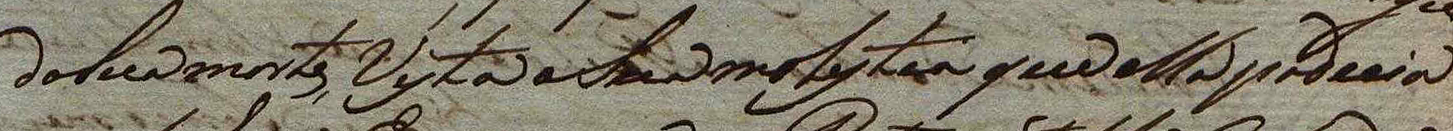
da Sua morte, Vista a Sua molestia que ella padecia
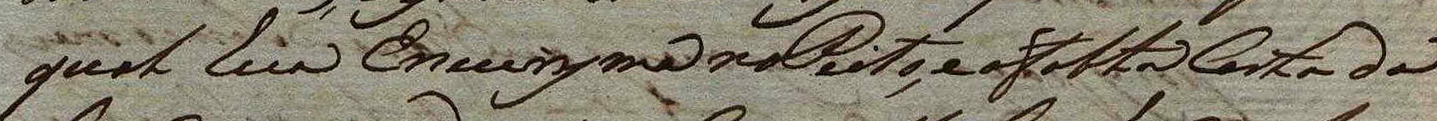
qual hua Eneurysma no Peito, e a falta Certa da
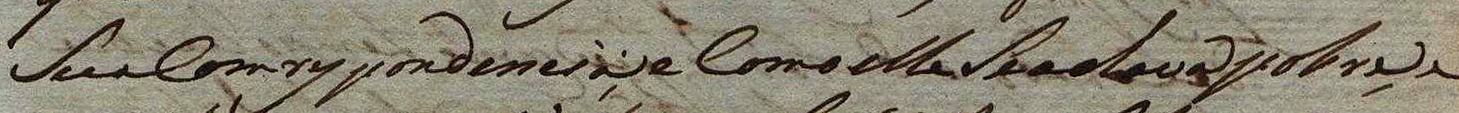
Sua Comrespondencia, e Como elle Se achava pobre, e
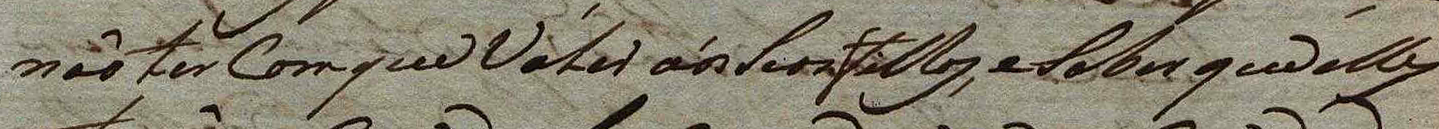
naõ ter Com que VaLer aós Seos filhos, e Saber que elles
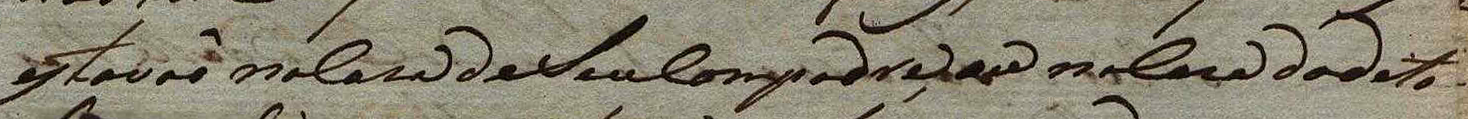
estavaõ na Caza do Seu Compadre, ou na Caza do dito
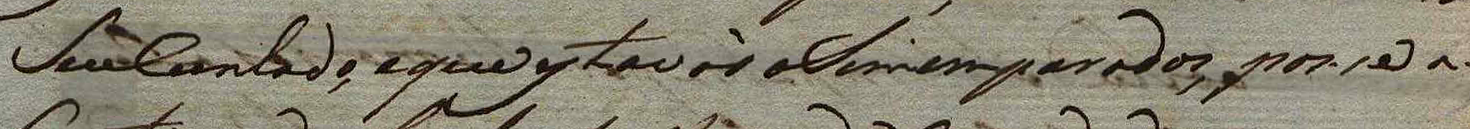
Seu Cunhado, e que estavaõ aSim emparados, pos-se a
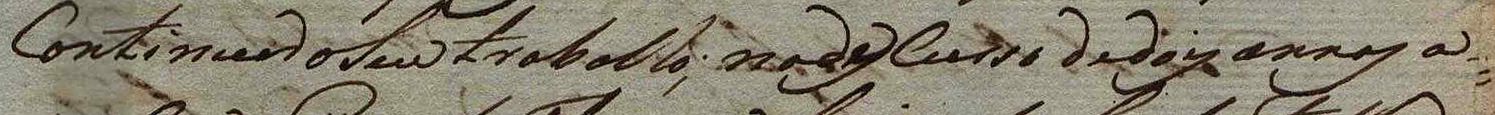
Continuar o Seu trabalho; no deCurso de dois annos a
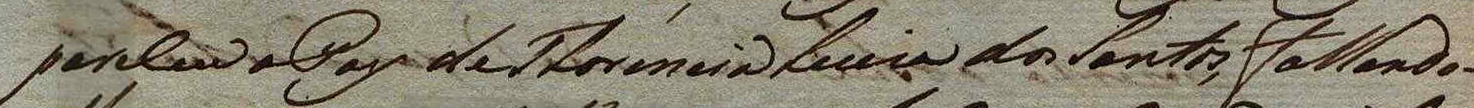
pareCeu o Pay de Florencia Luiza dos Santos, fallando
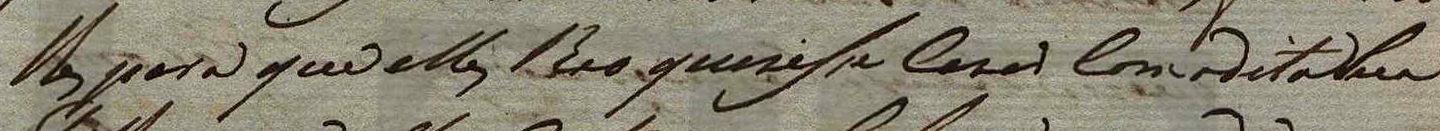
lhe para que elle Reo quezesse Cazar Com o dita Sua
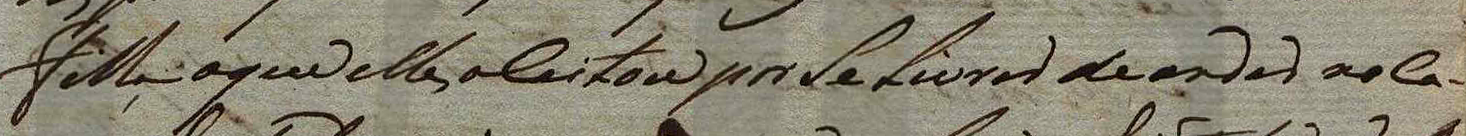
filha, o que elle aCeitou por Se Livrar de andar no Ca
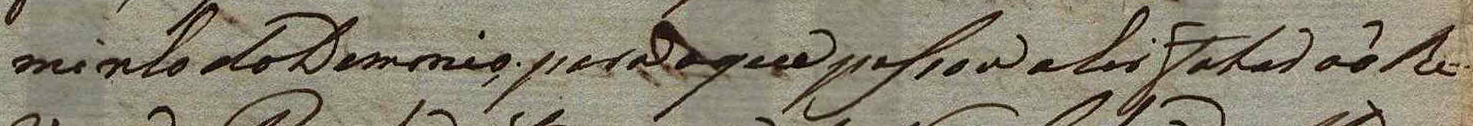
minho do Demonio; para o que passou a hir falar aõ Re
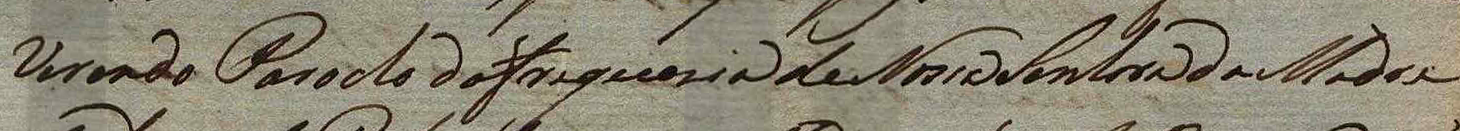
Verendo Parocho da freguezia de Nossa Senhora da Madre
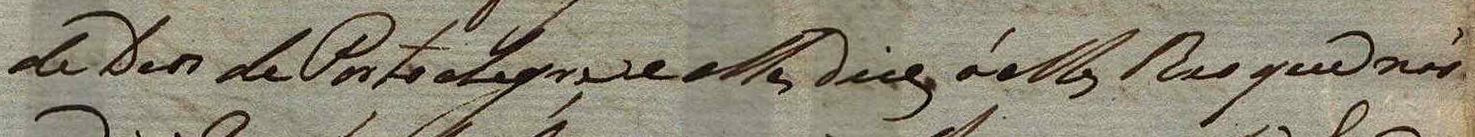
de Deos de Porto alegre, e elle dice á elle, Reo que naõ
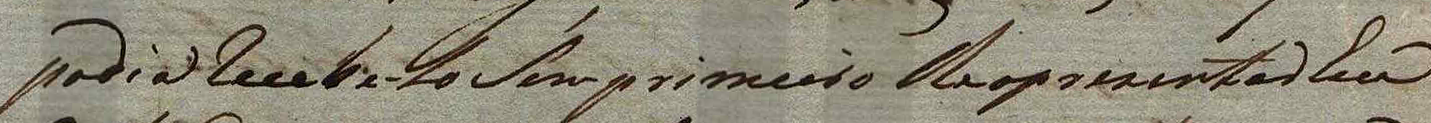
podia Recebe-Lo Sem primeiro lhe aprezentar hua
